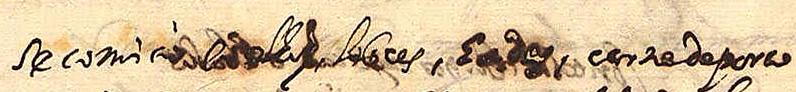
se comiaõ Coelhos Lebres, E aues, carne de porco
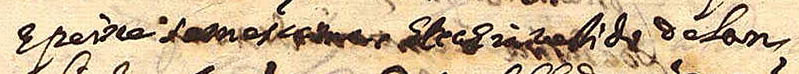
E peixe sem escamas E trazia vestido de lan
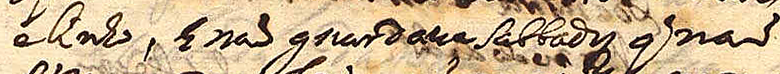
e linho, E naõ guardaua Sabbados q̄ naõ
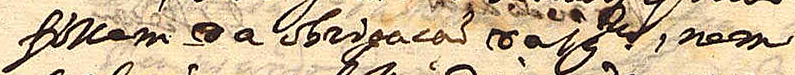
fossem da obrigaçaõ dos g.des, nem
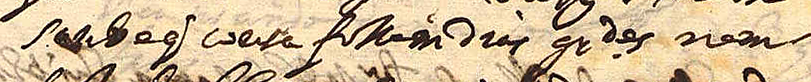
se sabe q̄ cousa fossem dias gr.des nem
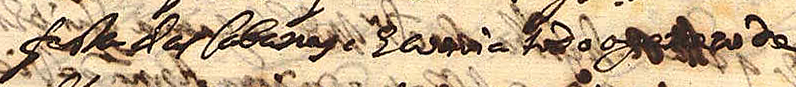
festa das Cabanas e E comia todo o genero de
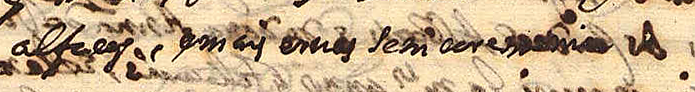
alfaces, e mais eruas sem ceremonia
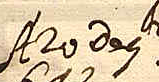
A 20 de 9bro
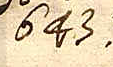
643.
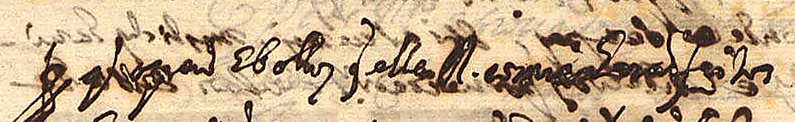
p̄ q̄ o paõ E bolloz q̄ ella R. comia heraõ feitos
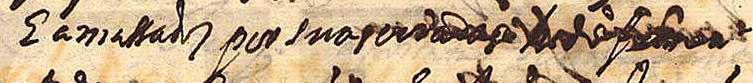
E amassados por suas creadas tudo ferma
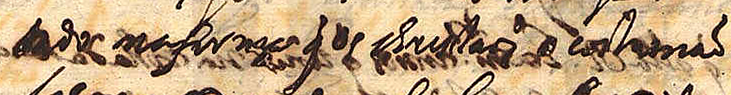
tado na forma q̄ os christaos o costumaõ
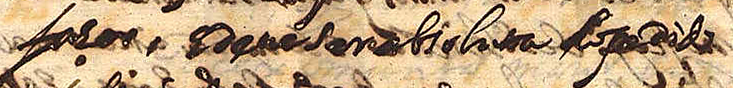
fazer, E deve ser absolutta do pedido
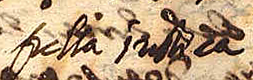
pella iustica
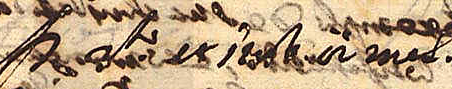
p̄ at.o ex iust.a crime.
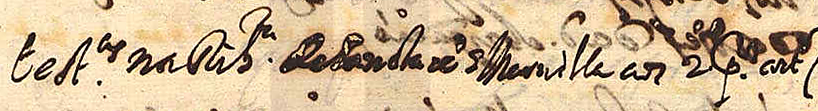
test.as na Rib.a de Sancta ã d Marvilla e os 2 ꝓ.es art.os
